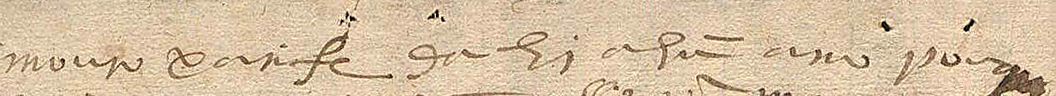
mouro xarife dahi a hū ano pouquo
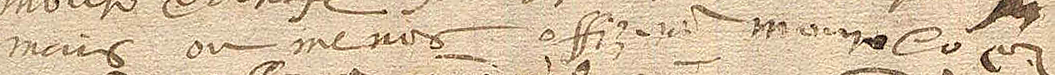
mais ou menos o fizerā mouro e o cor
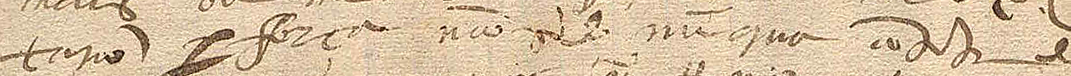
tarão ꝑ força naõ sēdo nūqua c̄otēte de
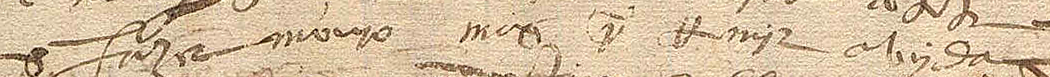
se fazer mouro mas p̄o Remjr a vyda
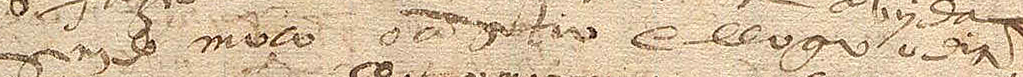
semdo moço o cōsētio e llogo o dito
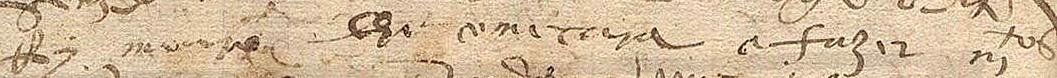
Rey mouro lhe começara a fazer mtos
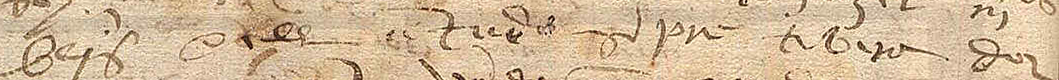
bej̄s e elle ē tudo sēpre tivera dor
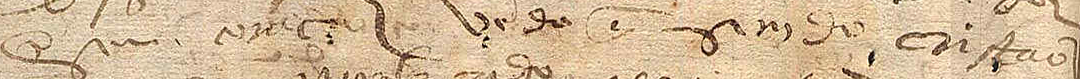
ē seu coraçaõ vēdo q̄ semdo cristaõ
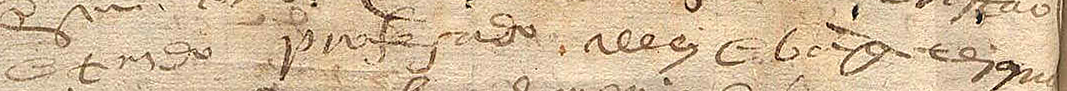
e temdo profesado a llej evāgelliqua
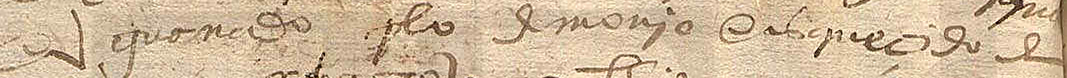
e ēguanado p̄lo demonjo e esquecido de
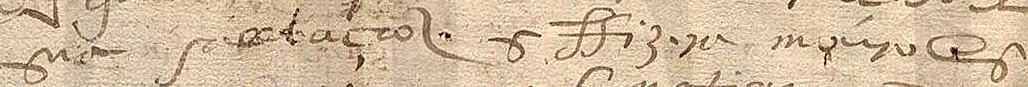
sua salluaçaõ se ffizera mouro e se
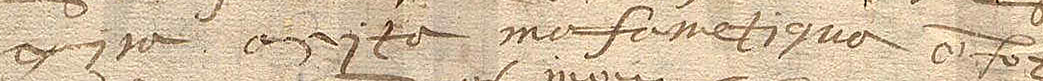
gujra a cejta mafametiqua cōfor
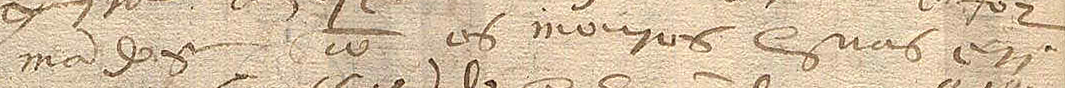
mādose cō os mouros e suas cerj
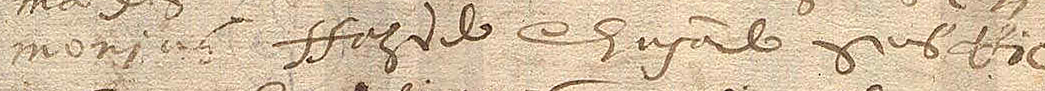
monjas ffazēdo e husādo seus Ric
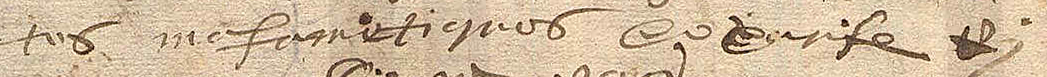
tos mafametiquos e o xarife Rej
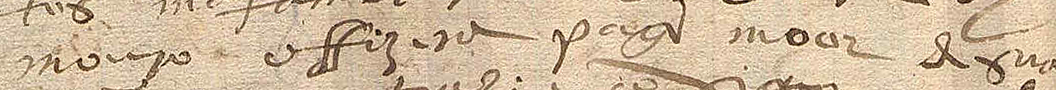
mouro o ffizera pagē moor de sua
